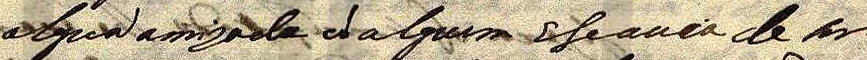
alguā amizade cō alguem E se auia de tor
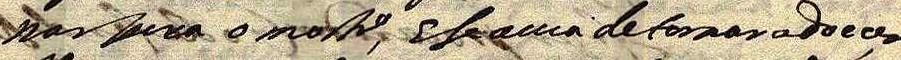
nar pera o mostro, E se auia de tornar adoeçer
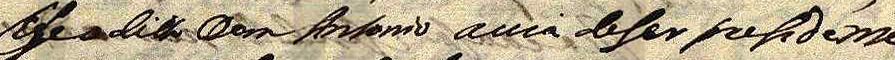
E se o ditto Dom Antonio auia de ser presidente
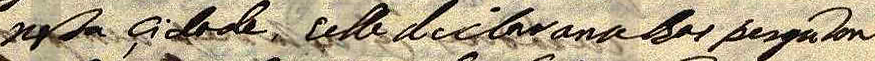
nesta çidade, E elle declarante lhas pergūtou
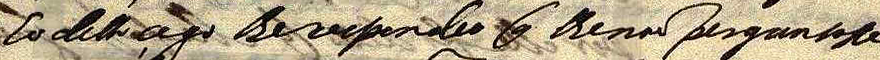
E o ditto çego lhe respondeo q̄ lhe naõ perguntasse
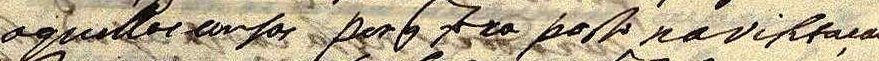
aquellas cousas porq̄ fora posto na visitaçaõ
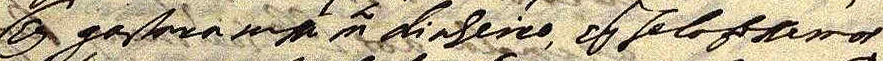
E q̄ gastara nisso mto dinheiro, E q̄ se la fossem os
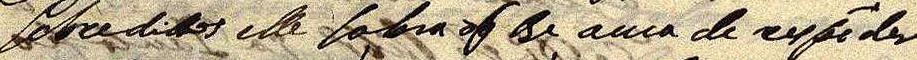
sobredittos elle sabia o q̄ lhe auia de respōder
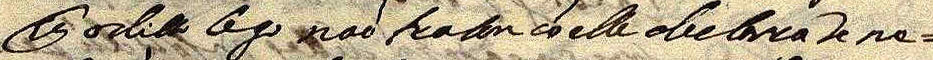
E q̄ o ditto cego naõ tratou cō elle declarāte ne
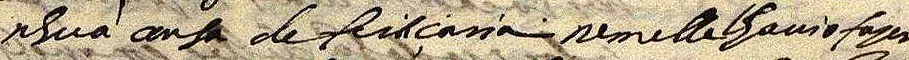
nhuā cousa de feitiçaria nem elle lha uio fazer
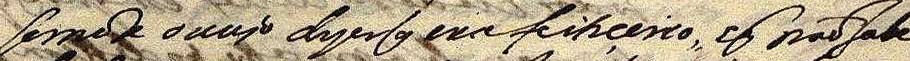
somēte ouujo dizer q̄ era feitiçeiro, E q̄ naõ sabe
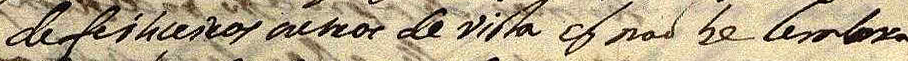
de feitiçeiros outros de vista E q̄ naõ he lembra
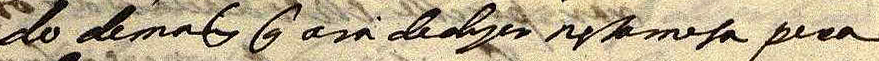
do de mais q̄ aia de dizer nesta mesa pera
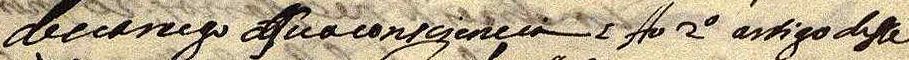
descarrego de sua consciencia E Ao 2o artigo disse
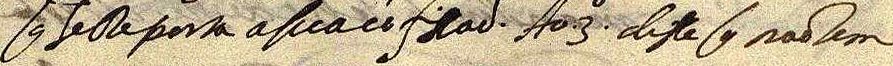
q̄ se Reporta a sua cōfissaõ. Ao .3o. disse q̄ naõ tem
